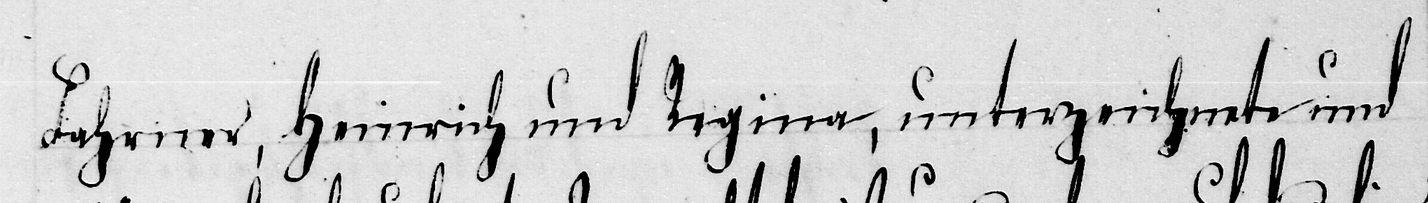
Fahrner, Heinrich und Regina, unterzeichnete und
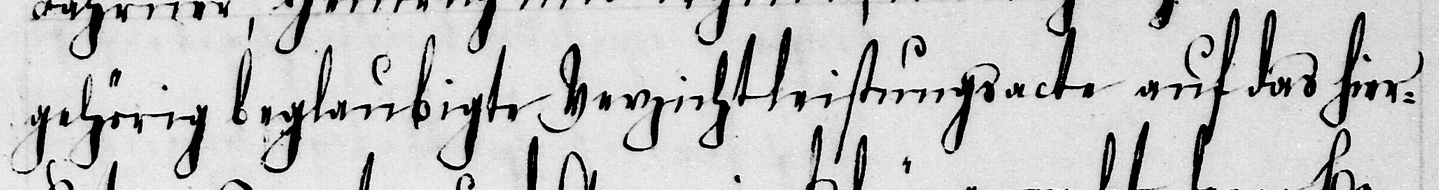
gehörig beglaubigte Verzichtleistungsacte auf das hier¬
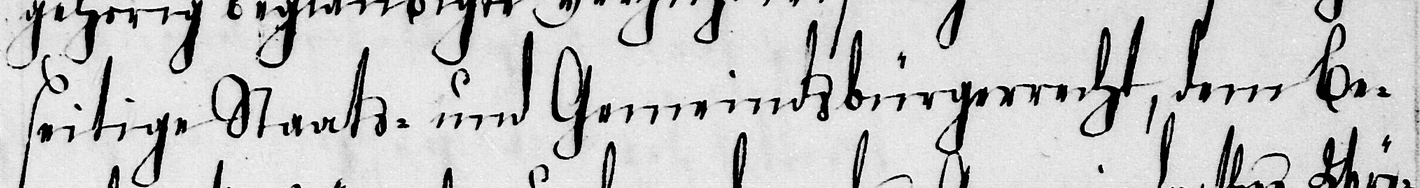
seitige Staats- und Gemeindsbürgerrecht, dem Be¬
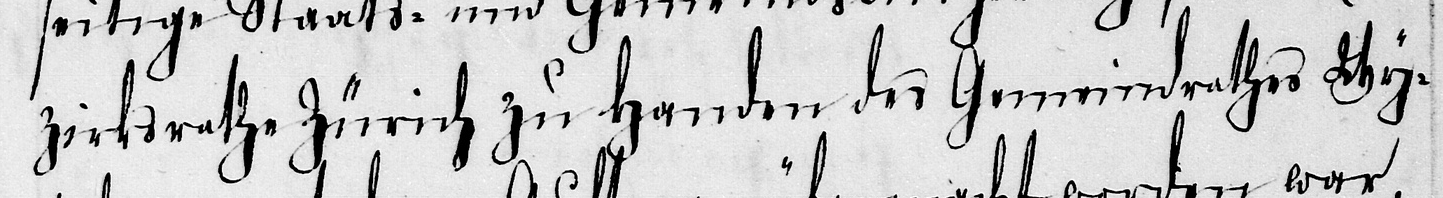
zirksrathe Zürich zu Handen des Gemeindrathes Wy¬
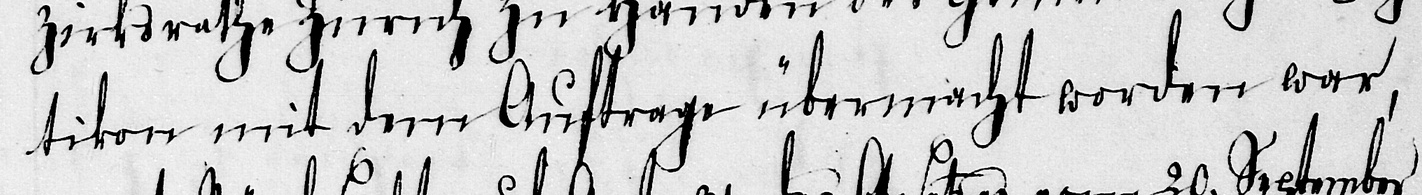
tikon mit dem Auftrage übermacht worden war,
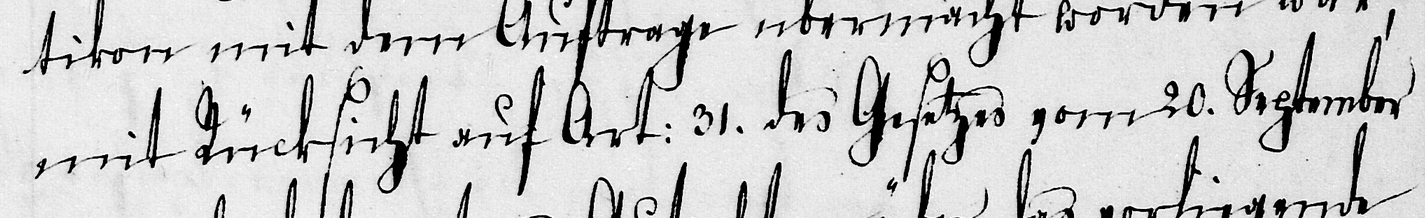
mit Rücksicht auf Art: 31. des Gesetzes vom 20. September
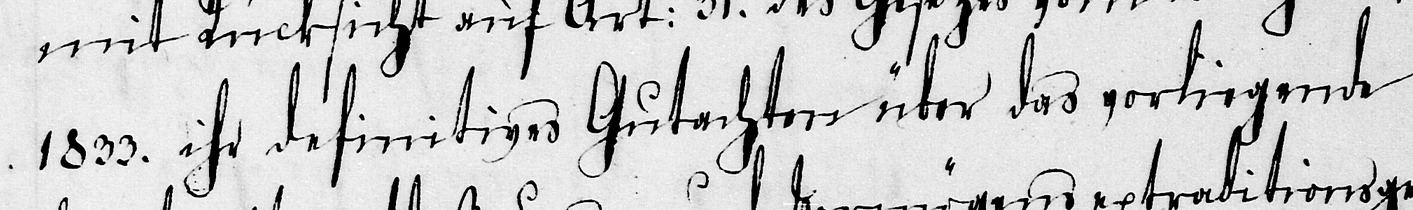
1833. ihr definitives Gutachten über das vorliegende
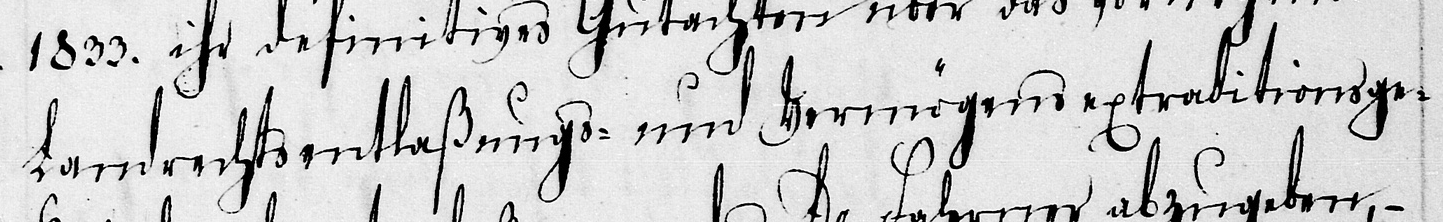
Landrechtsentlaßungs- und Vermögensextraditionsge¬
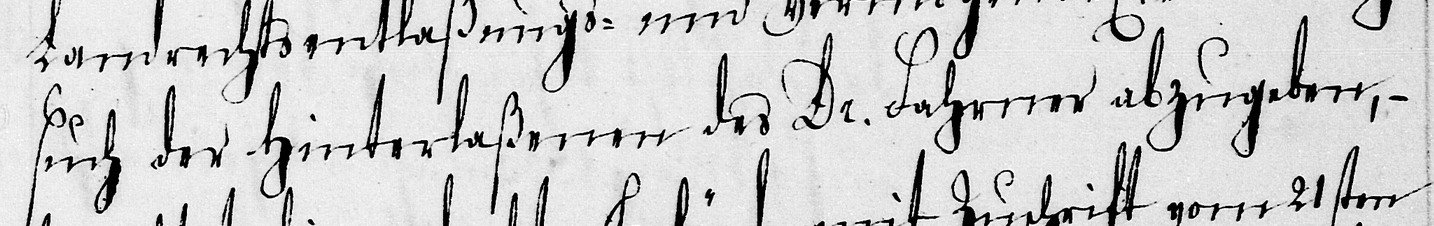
such der hinterlaßenen des Dr. Fahrner abzugeben, –
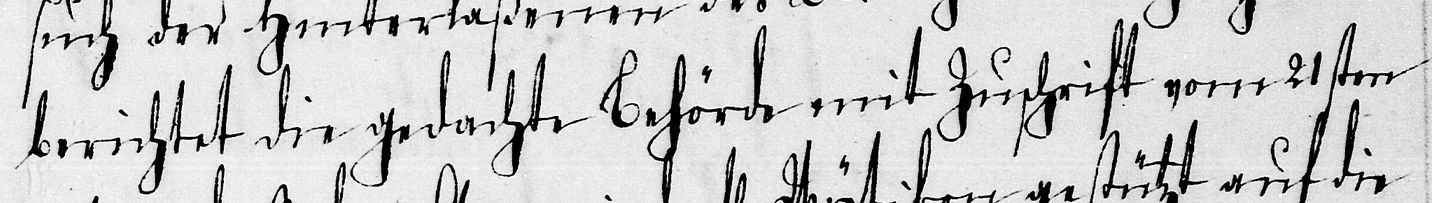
berichtet die gedachte Behörde mit Zuschrift vom 21sten
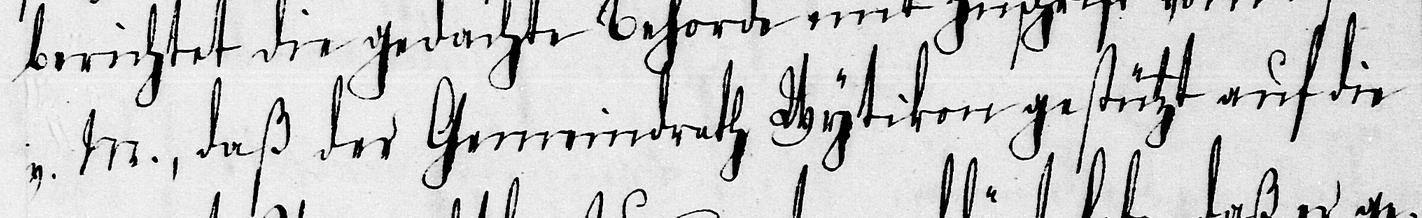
v. M., daß der Gemeindrath Wytikon gestützt auf die
